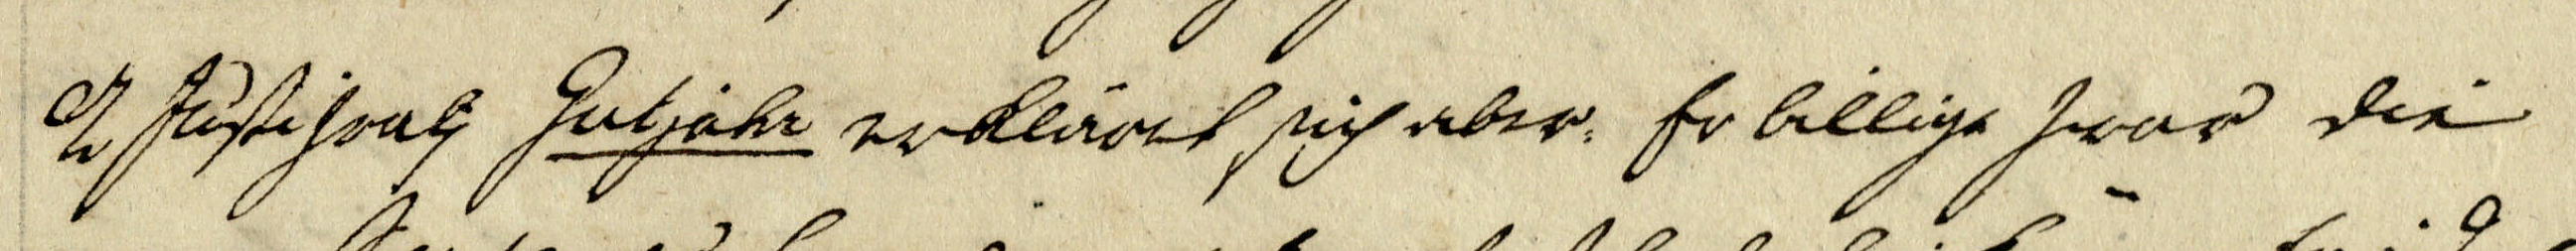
dh. Justizrath Gutjahr erkläret sich aber: Er billige zwar die
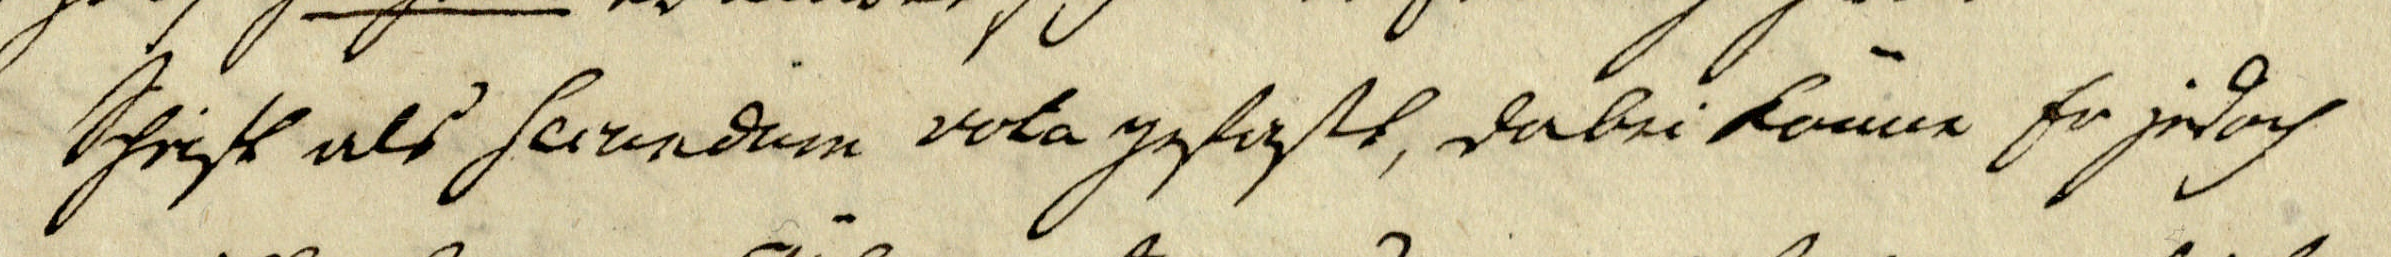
Schrift als secundum vota gefaßt, dabei könne Er jedoch
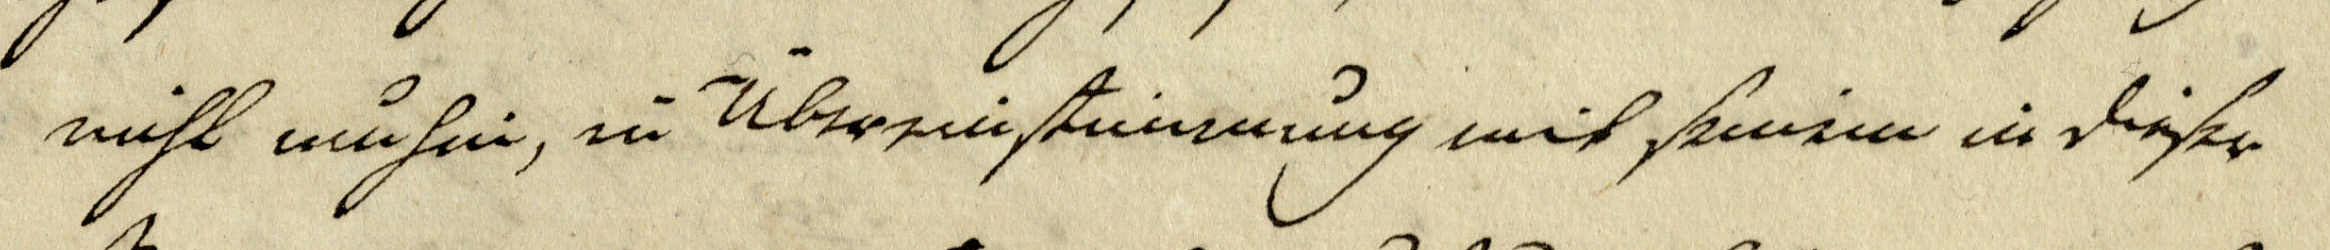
nicht umhin, in Übereinstimmung mit seinem in dieser
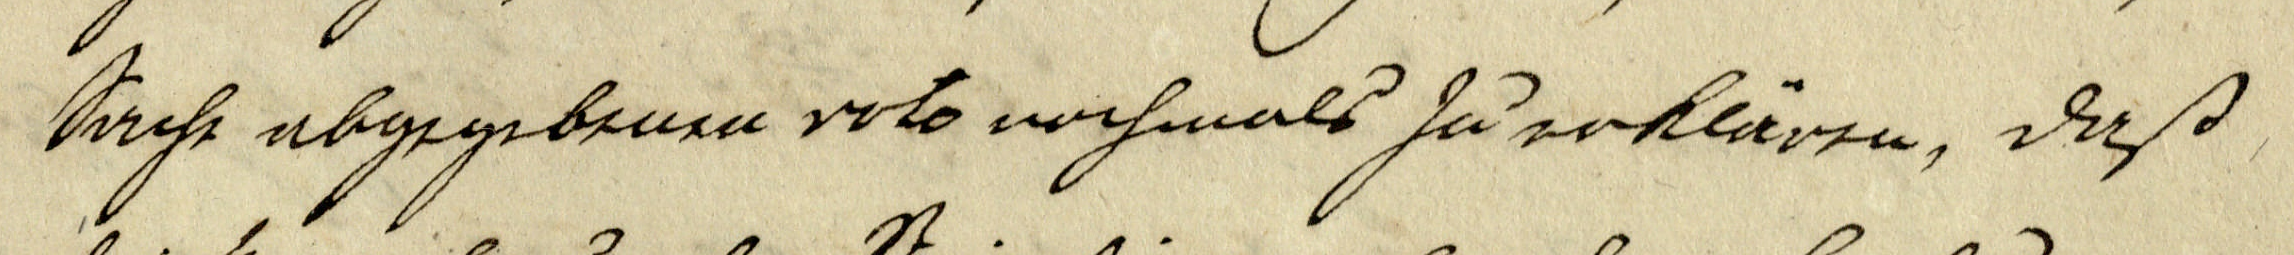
Sache abgegebenen voto nochmals zu erklären, daß
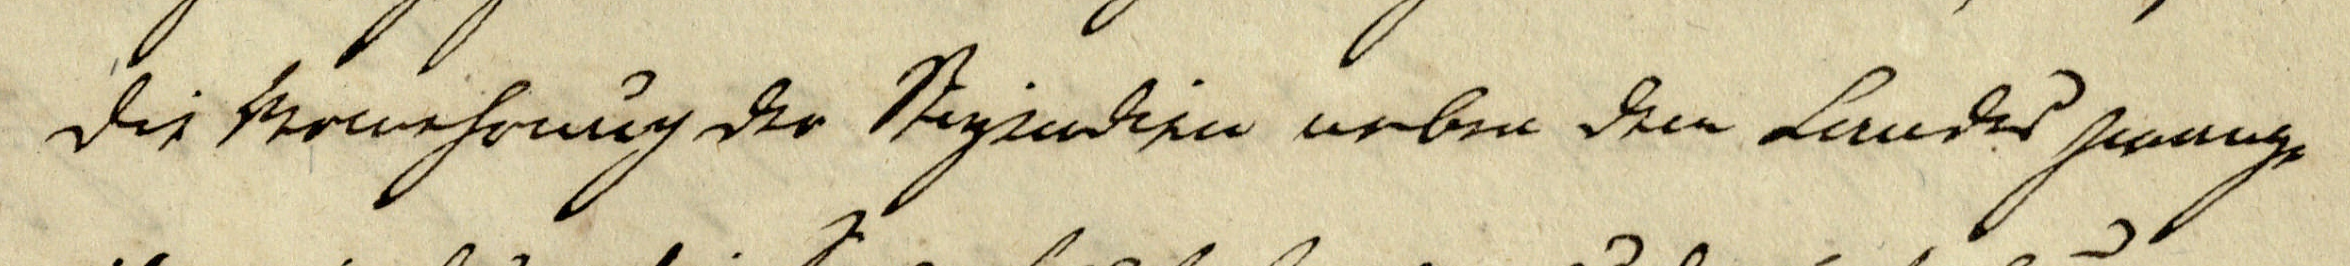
die Vermehrung der Stipendien neben dem Landeszwange
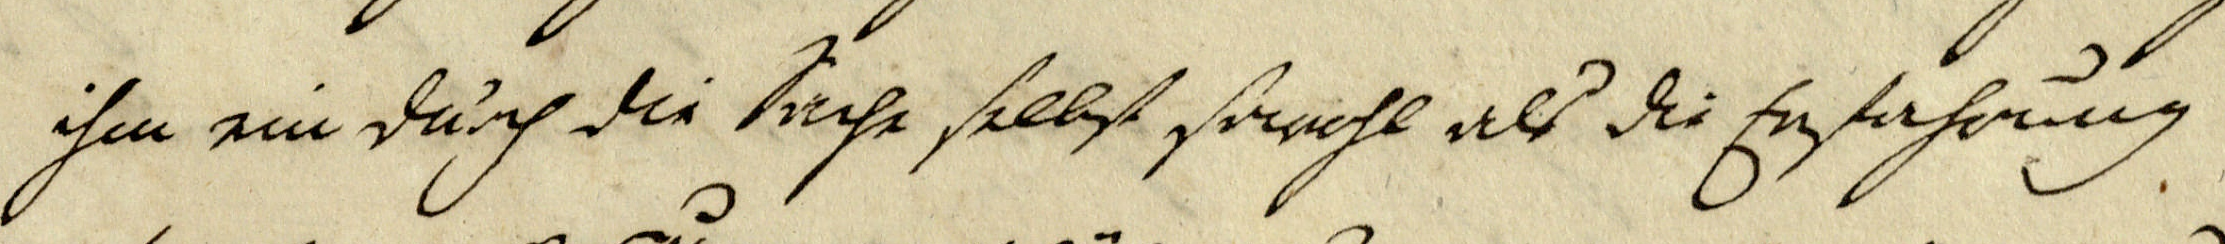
ihm ein durch die Sache selbst sowohl als die Erfahrung
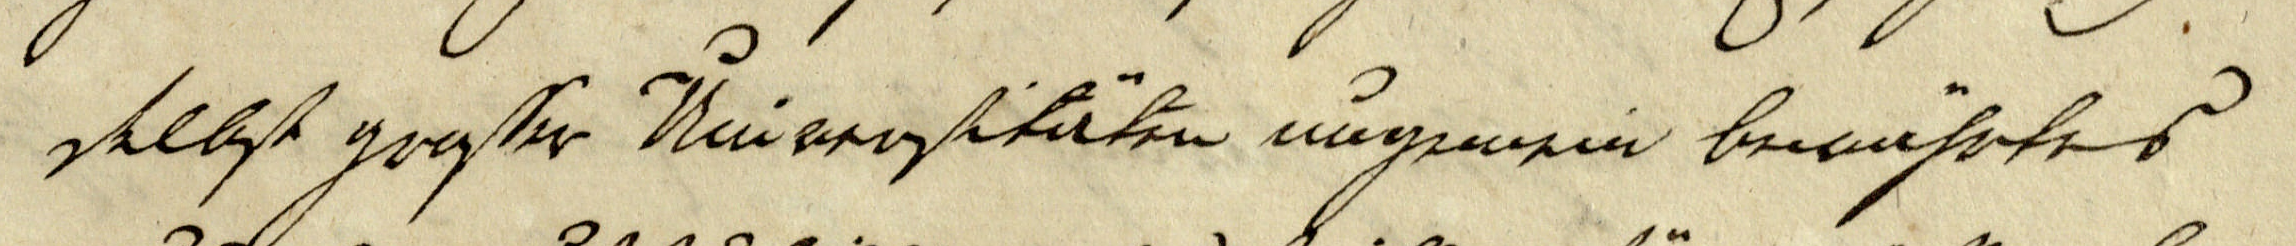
selbst grosser Universitäten ungemein bewährtes
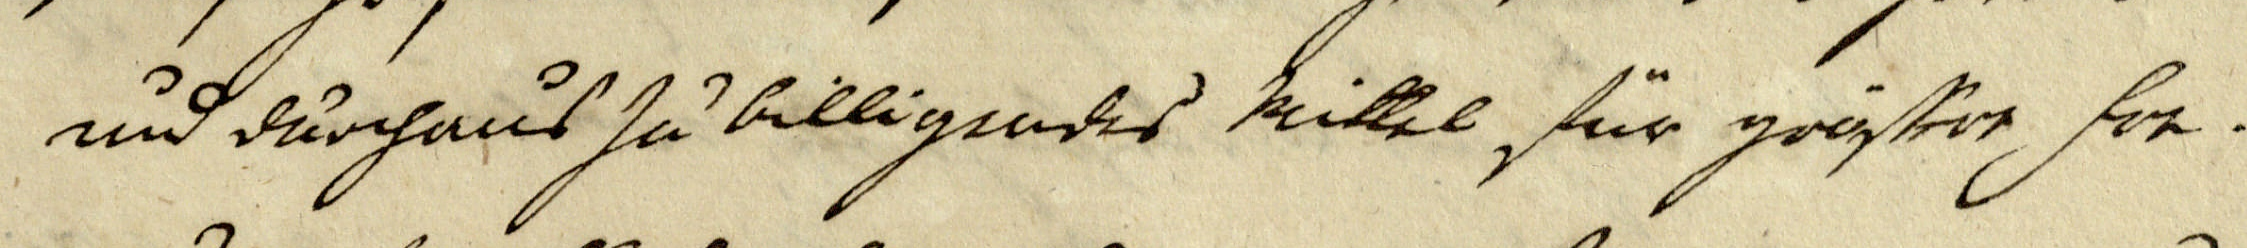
und durchaus zu billigendes Mittel für grössere Fre¬
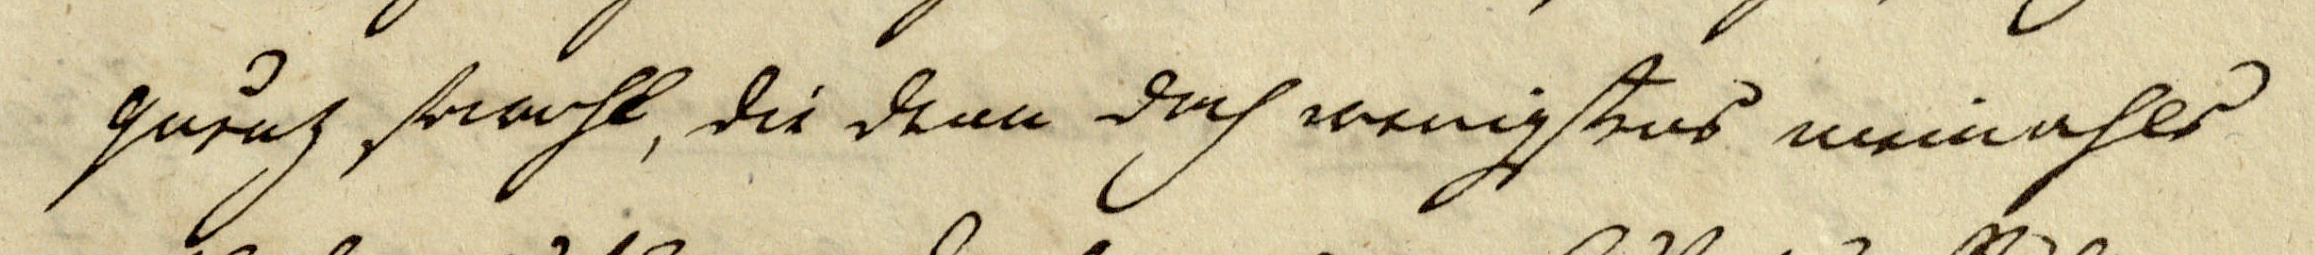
quenz sowohl, die denn doch wenigstens niemahls
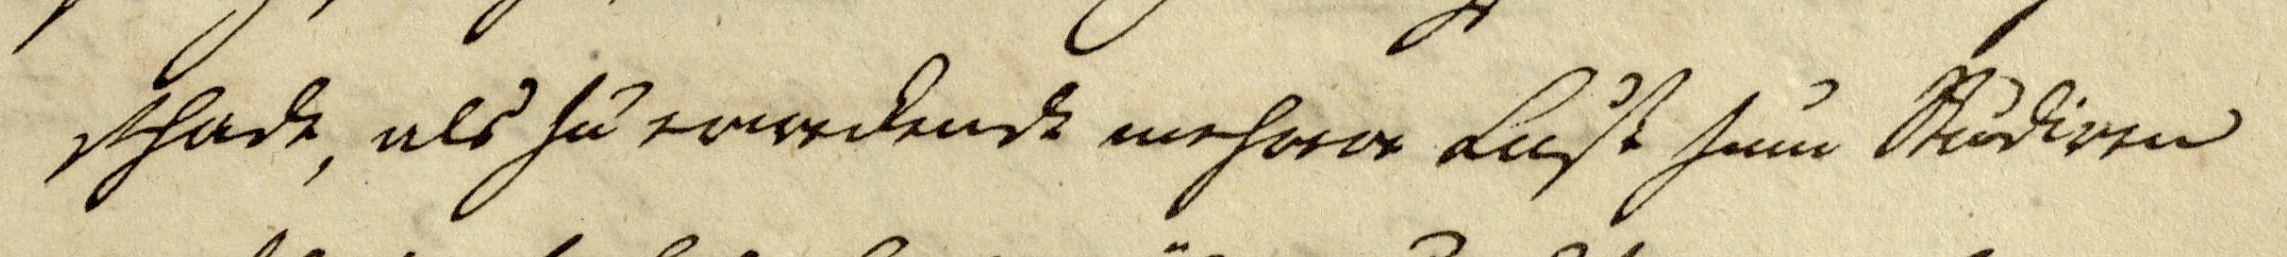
schade, als zu erweckende mehrere Lust zum Studiren
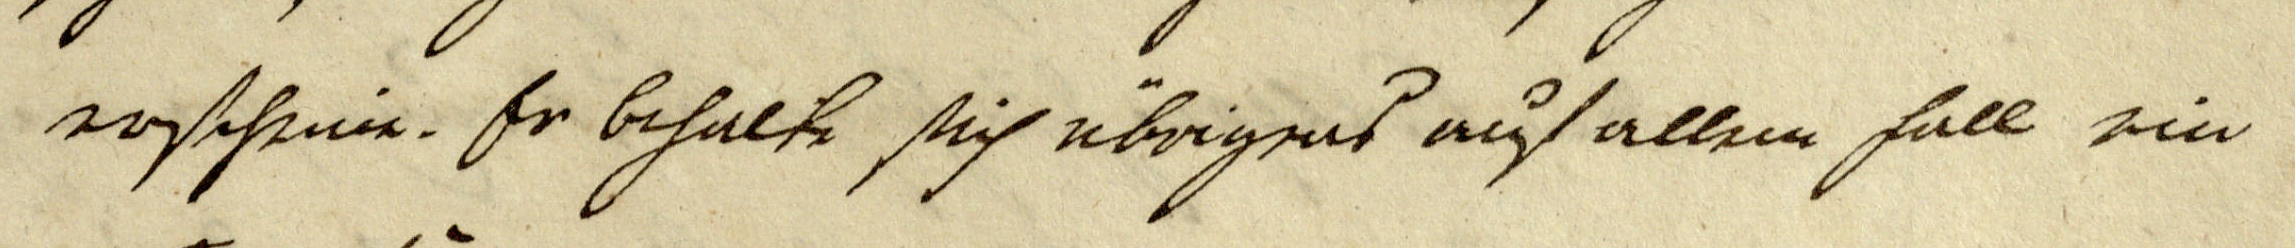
erscheine. Er behalte sich übrigens auf allen Fall ein
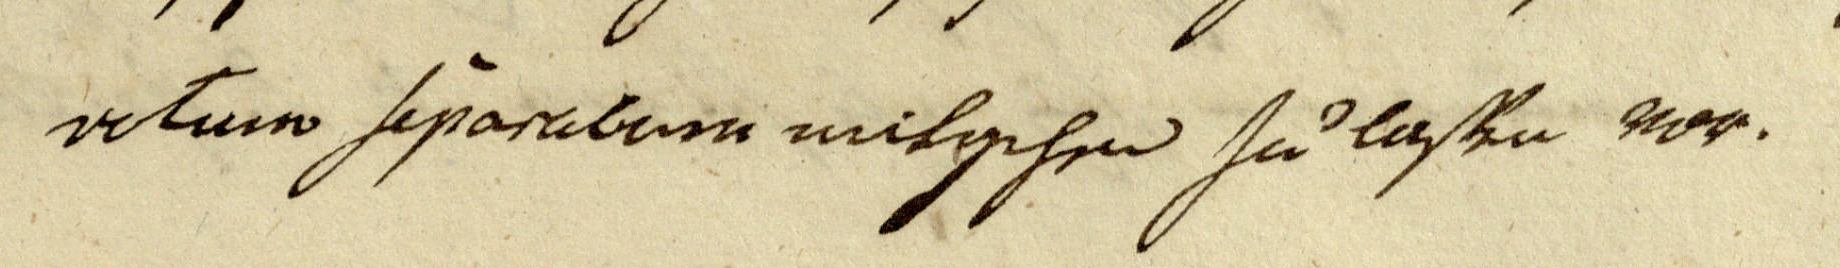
votum separatum mitgehen zu lassen vor.
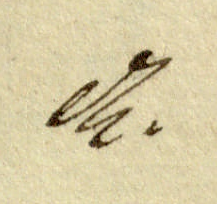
dh.
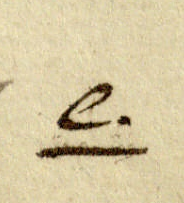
e.
